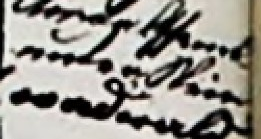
unter Wein
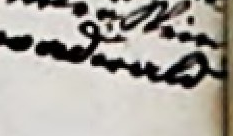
???wald
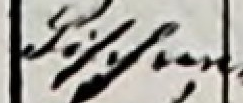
Fischern„
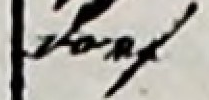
dorf
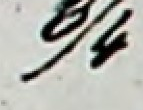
8/4
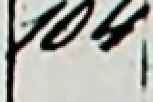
104
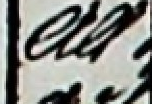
Alt
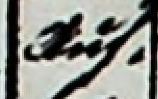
Aus„
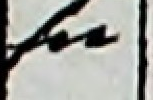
see
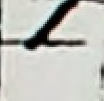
I
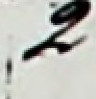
2
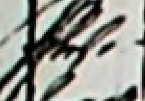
Pfd„
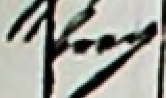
berg
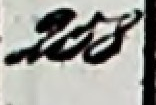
258
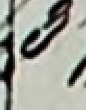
3
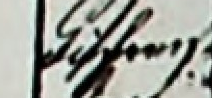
Fischern„
